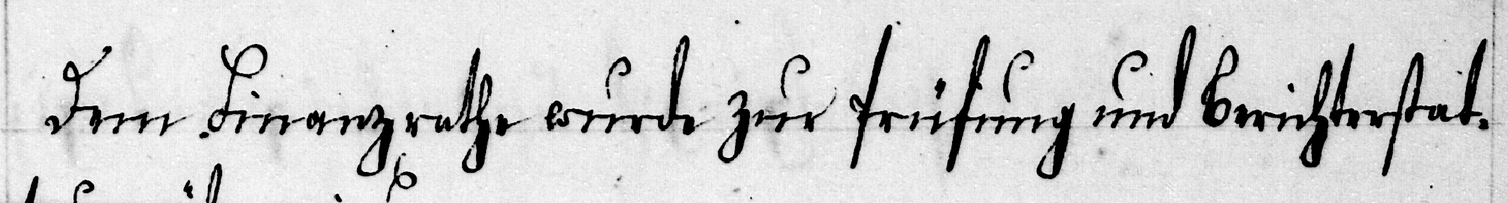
Dem Finanzrathe wurde zur Prüfung und Bericht¬
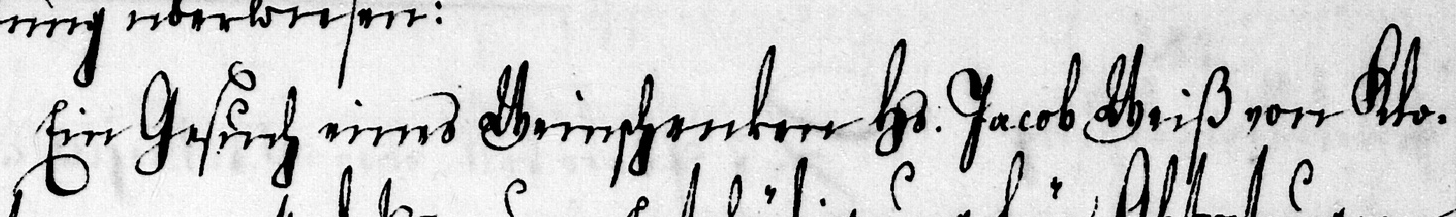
Ein Gesuch eines Weinschenken Hs. Jacob Weiß von Klo¬
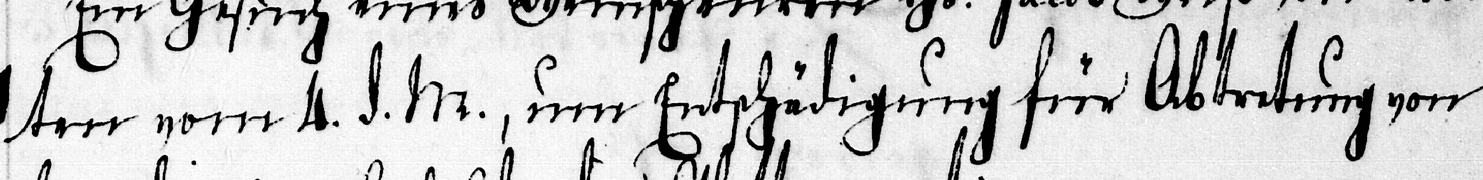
ten vom 4. d. M. um Entschädigung für Abtretung von
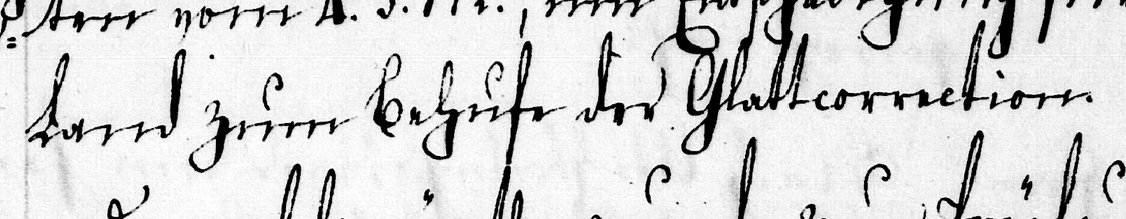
Land zum Behufe der Glattcorrection.
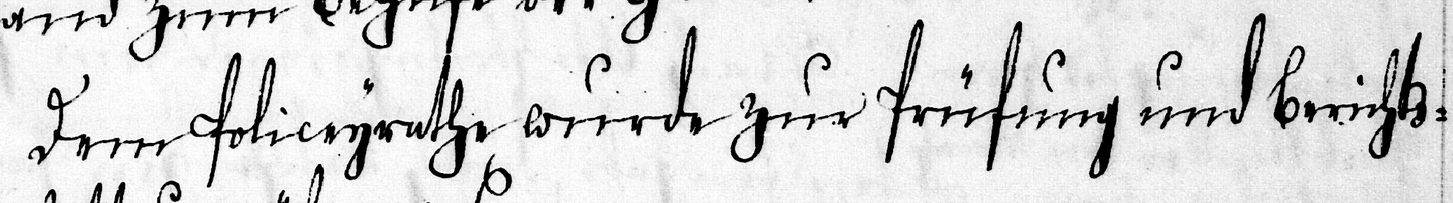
Dem Policeyrathe wurde zur Prüfung und Bericht¬
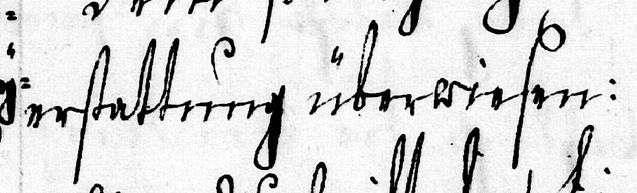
erstattung überwiesen:
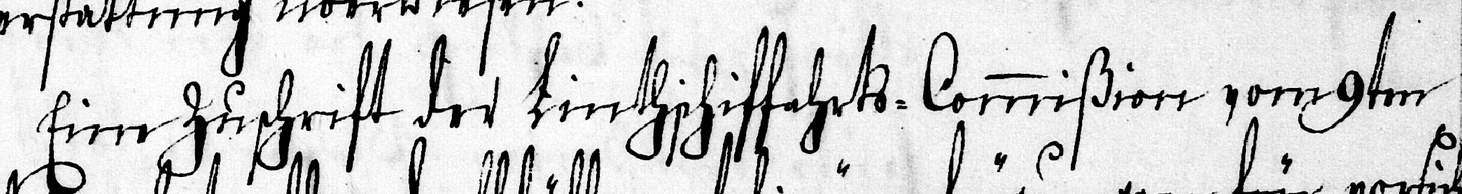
Eine Zuschrift der Linthschiffahrts-Commißion vom 9ten
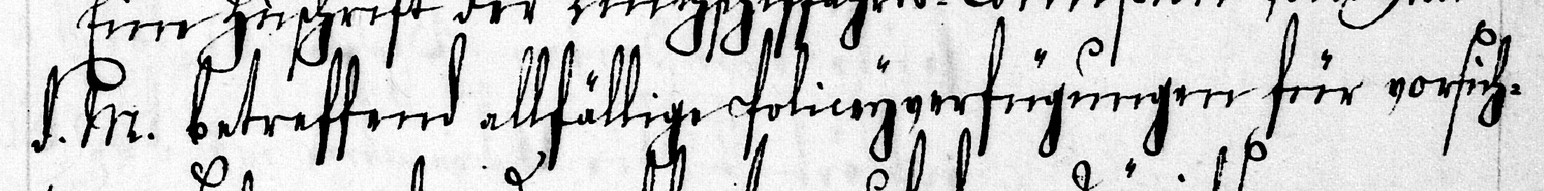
d. M. betreffend allfällige Policeyverfügungen für vorsich¬
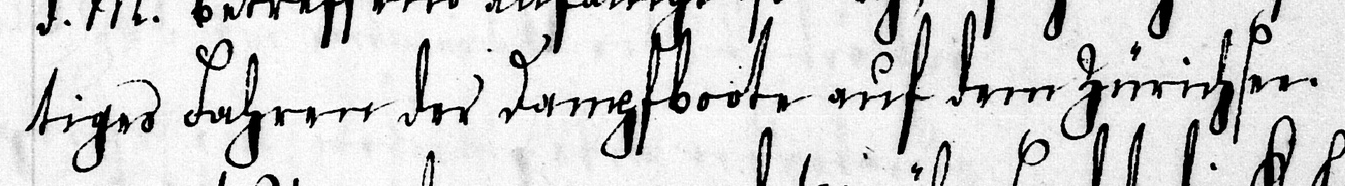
tiges Fahren der Dampfboote auf dem Zürichse¬
